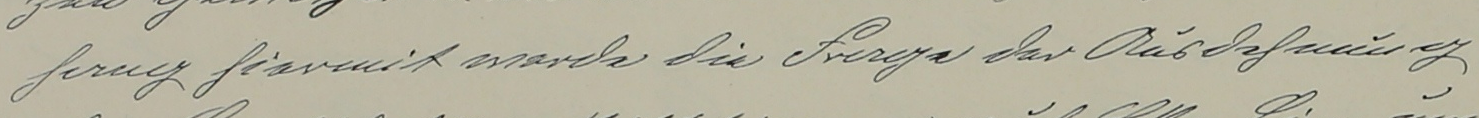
hang hiermit werde die Frage der Ausdehnung
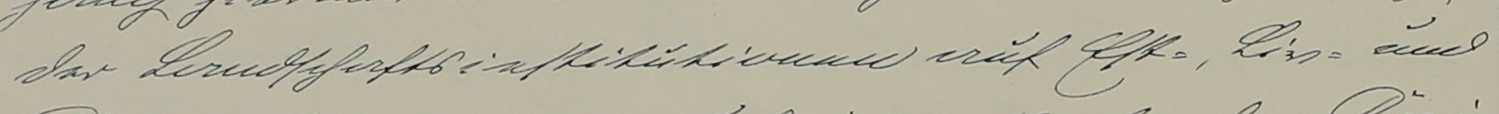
der Landschaftsinstitutionen auf Est-, Liv- und
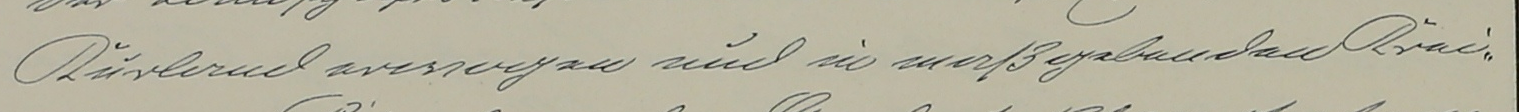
Kurland erwogen und in maßgebenden Krei-
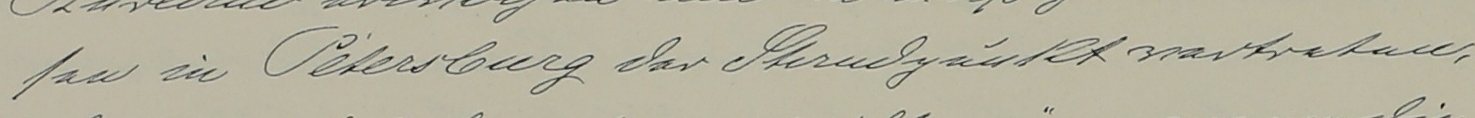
sen in Petersburg der Standpunkt vertreten,
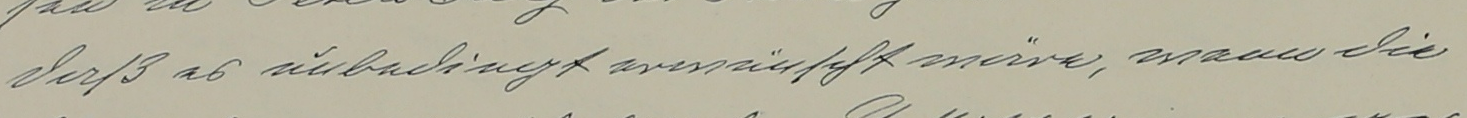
daß es unbedingt erwünscht wäre, wenn die
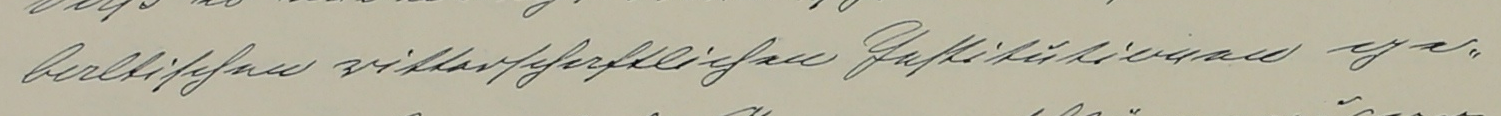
baltischen ritterschaftlichen Institutionen ge-
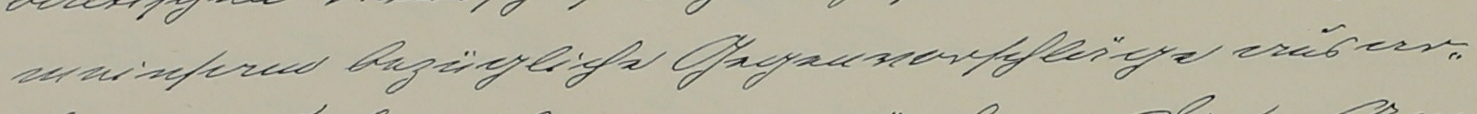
meinsam bezügliche Gegenvorschläge ausar-
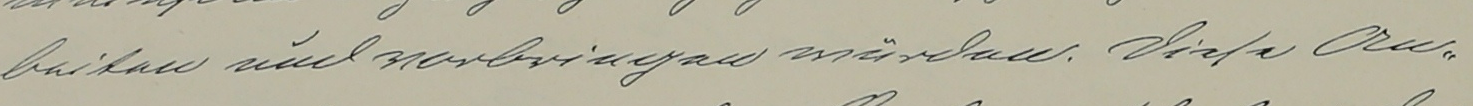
beiten und vorbringen würden. Diese An-
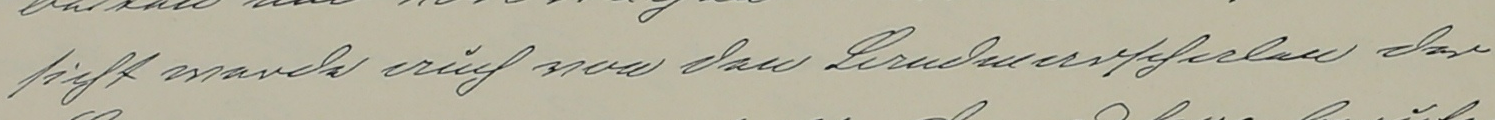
sicht werde auch von den Landmarschällen der
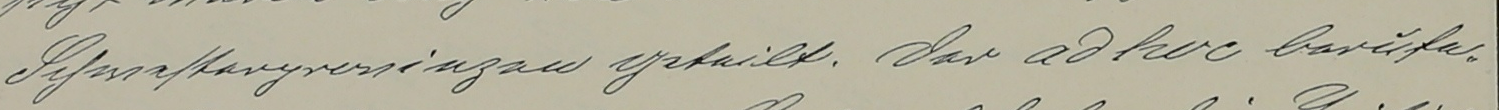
Schwesterprovinzen geteilt. Der ad hoc berufe-
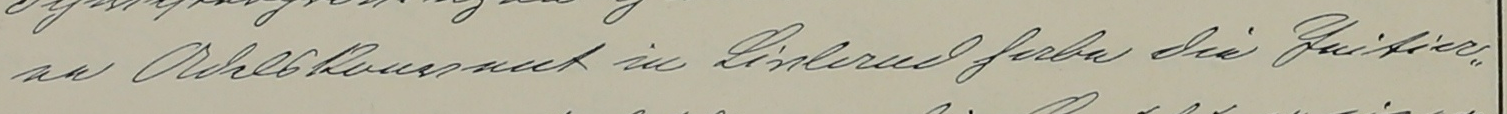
ne Adelskonvent in Livland habe die Initia-
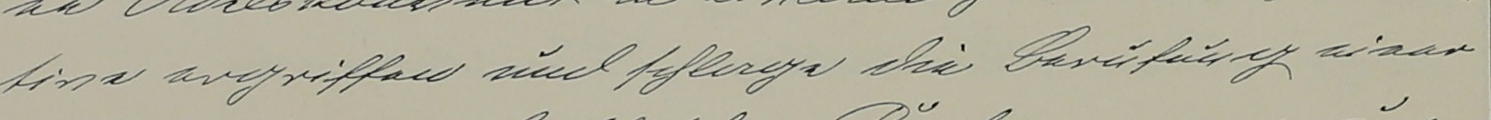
tive ergriffen und schlage die Berufung einer
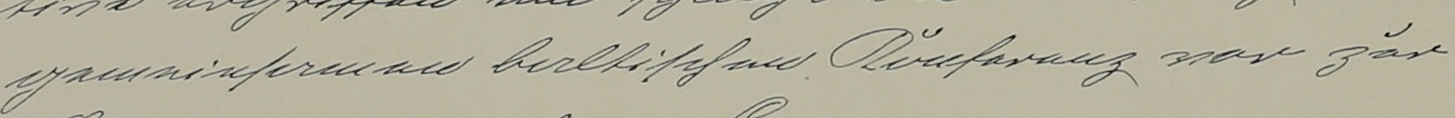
gemeinsamen baltischen Konferenz vor zur
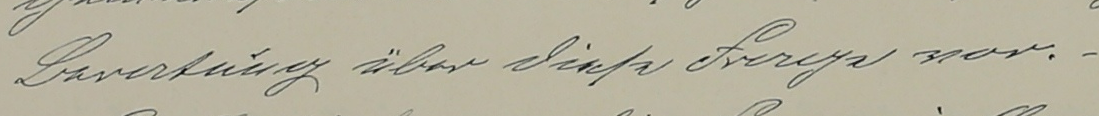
Beratung über diese Frage vor.
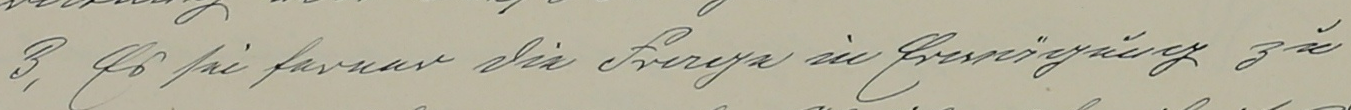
3. Es sei ferner die Frage in Erwägung zu
